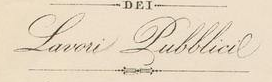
Lavori Pubblici
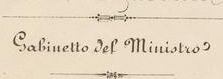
Gabinetto del Ministro
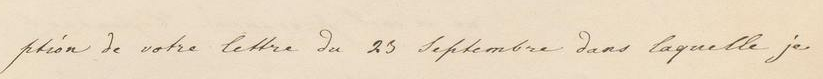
ption de votre lettre du 23 Septembre dans laquelle je
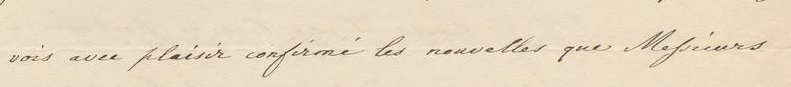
vois avec plaisir confirmé les nouvelles que Messieurs
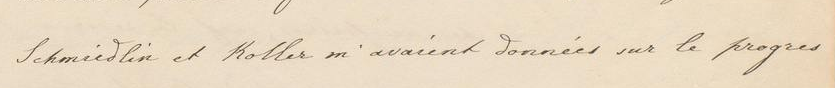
Schmiedlin et Koller m'avaient données sur le progres
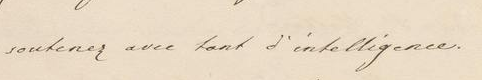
soutenez avec tant d'intelligence.
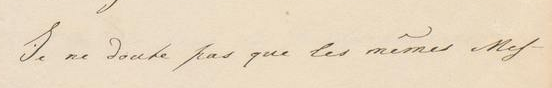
Je ne doute pas que les mêmes Mes-
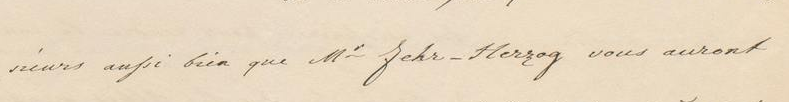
sieurs aussi bien que MrFehr–Herzog vous auront
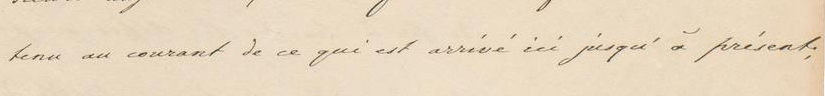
tenu au courant de ce qui est arrivé ici jusqu'à présent;
